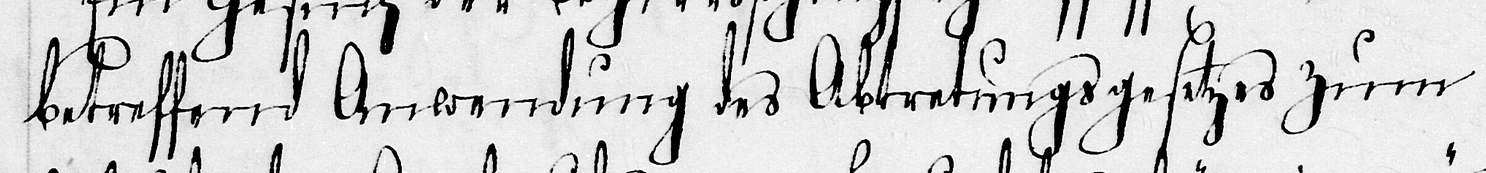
betreffend Anwendung des Abtretungsgesetzes zum
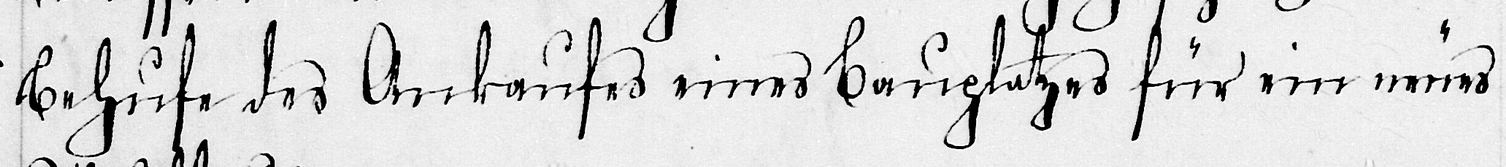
Behufe des Ankaufes eines Bauplatzes für ein neues
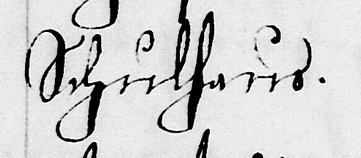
Schulhaus.
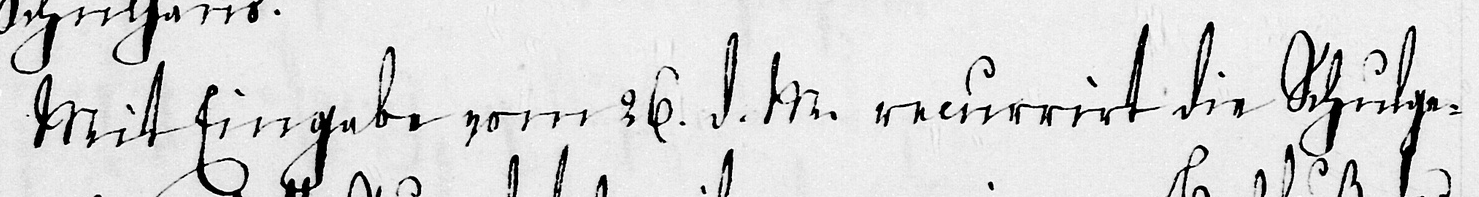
Mit Eingabe vom 26. d. M. recurrirt die Schulge¬
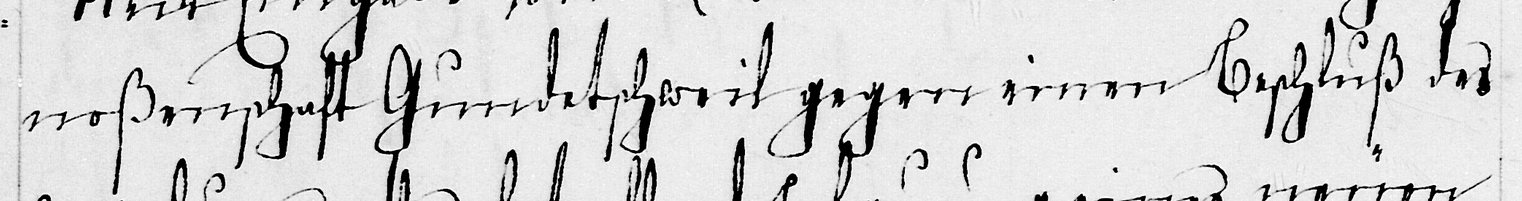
noßenschaft Gundetschweil gegen einen Beschluß des
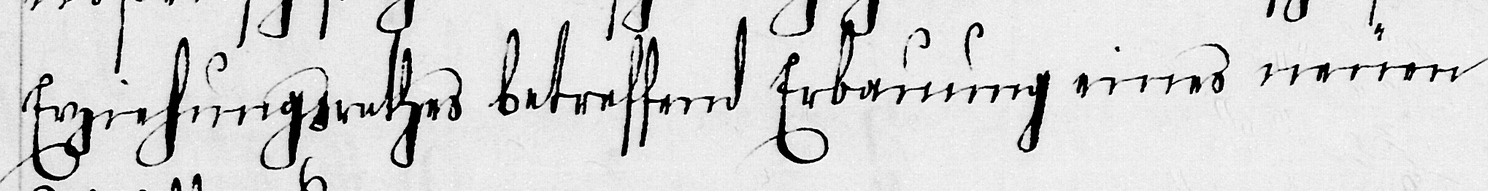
Erziehungsrathes betreffend Erbauung eines neuen
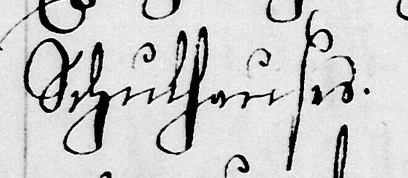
Schulhauses.
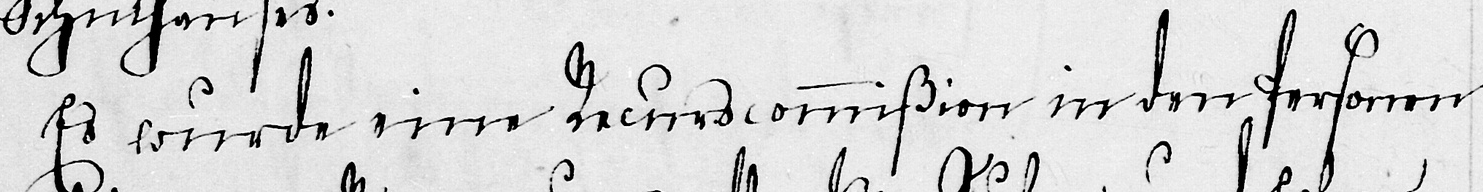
Es wurde eine Recurscommißion in den Personen
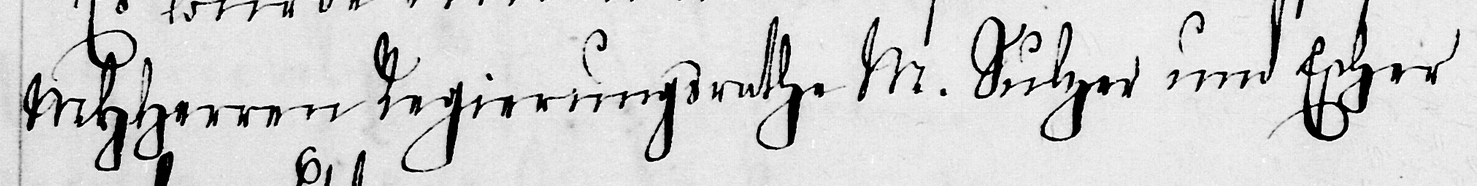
MHHerren Regierungsrathe M. Sulzer und Escher
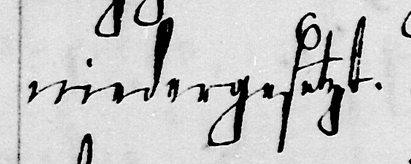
niedergesetzt.
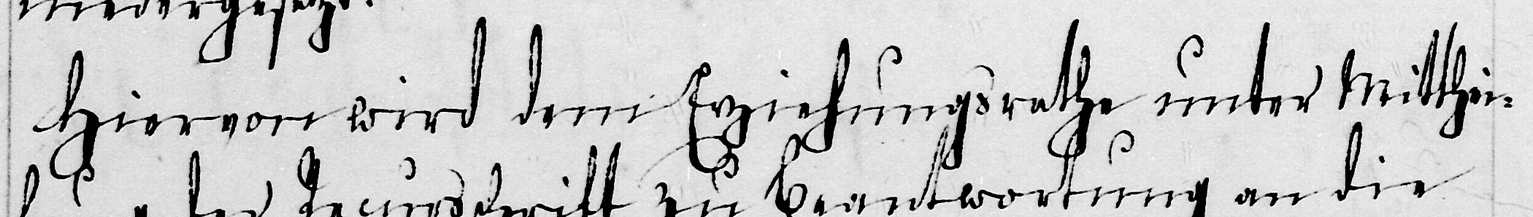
Hiervon wird dem Erziehungrathe unter Mitthe¬
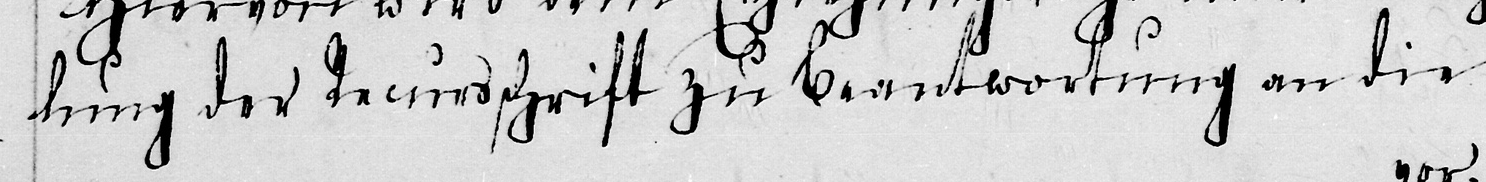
ilung der Recursschrift zu Beantwortung an die
